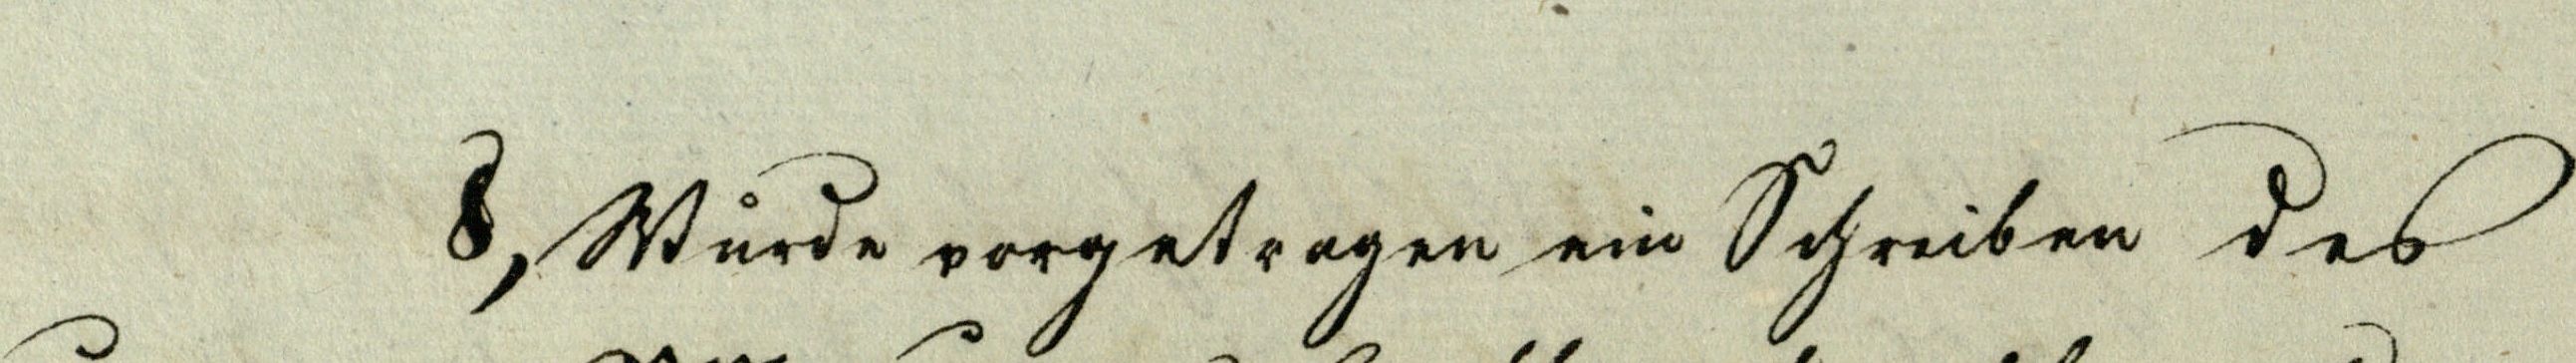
8, Wurde vorgetragen ein Schreiben des
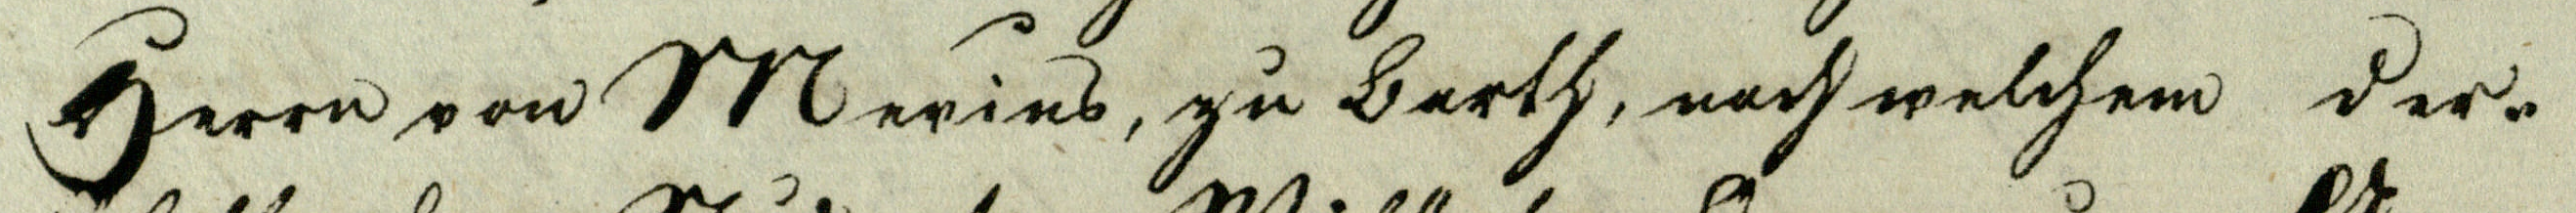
Herrn von Mevius, zu Barth, nach welchem der¬
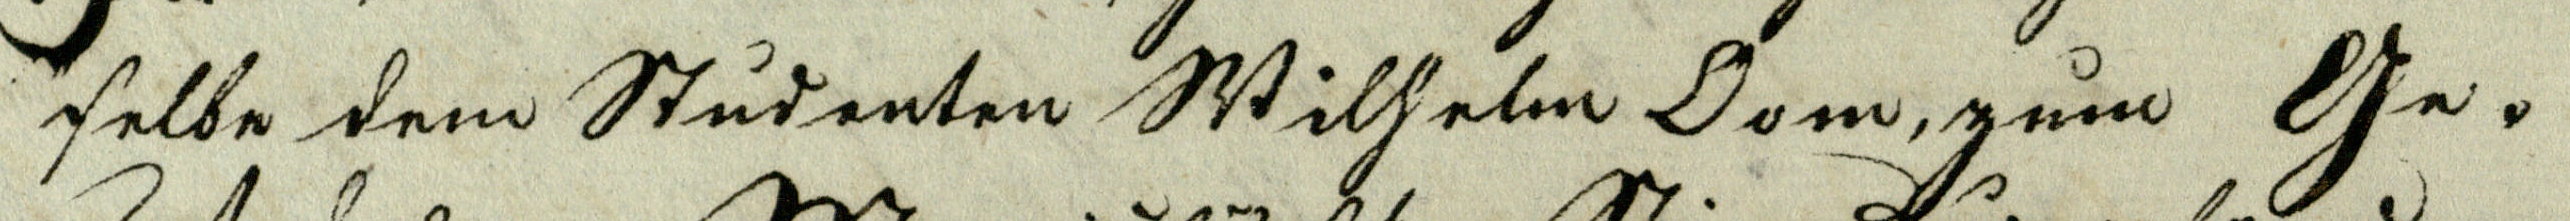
selbe dem Studenten Wilhelm Oom, zum Ge¬
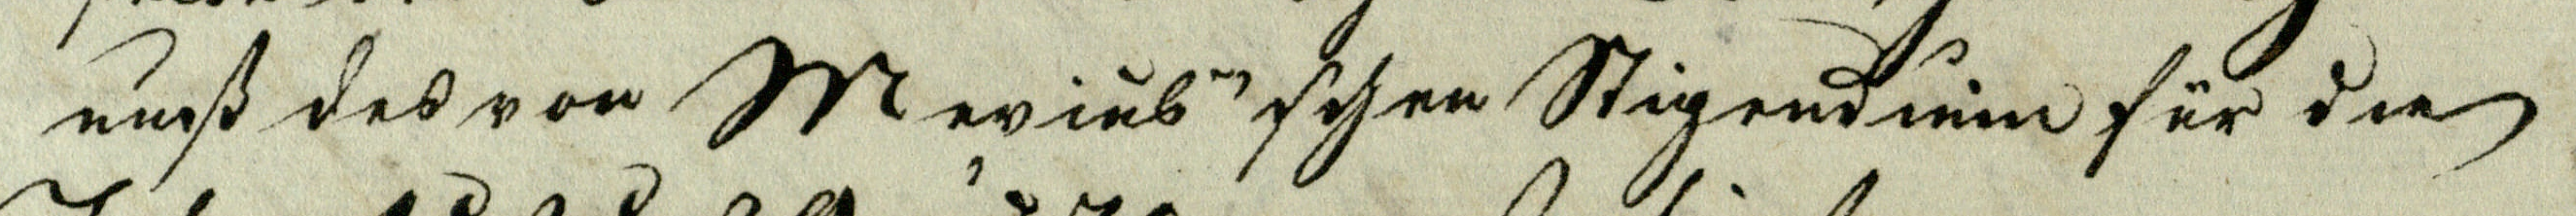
nuß des von Mevius'schen Stipendium für die
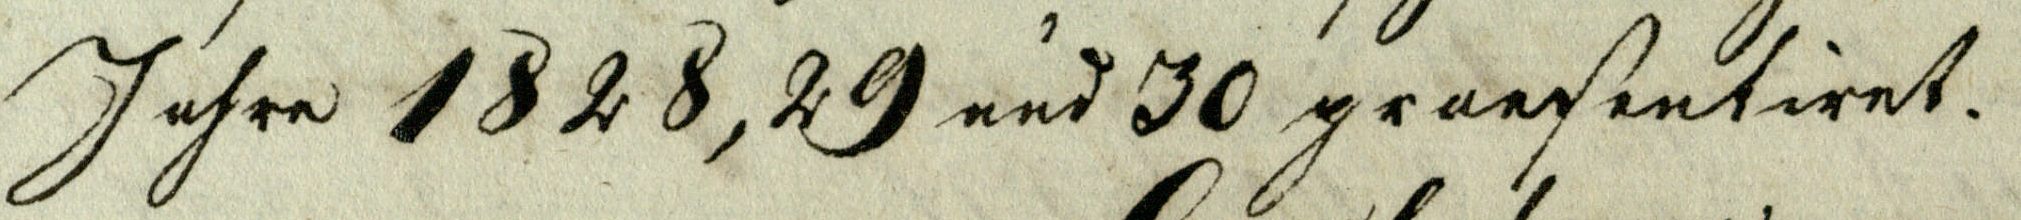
Jahre 1828, 29 und 30 praesentiret.
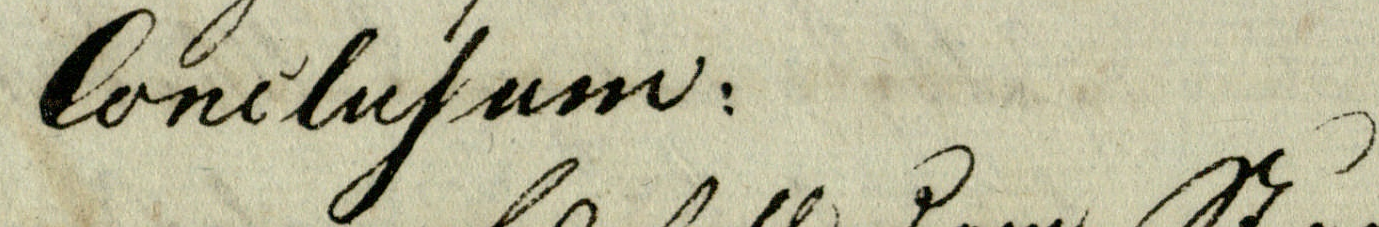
Conclusum:
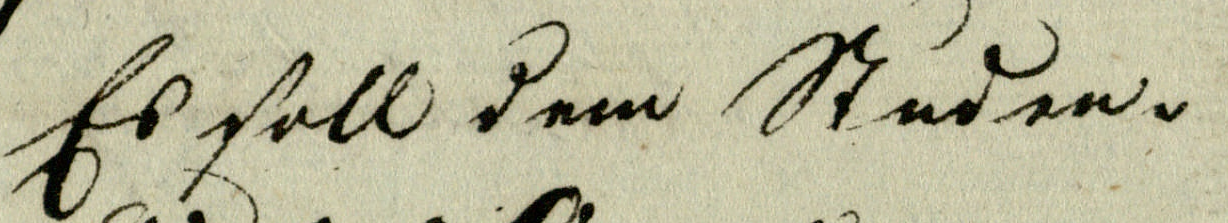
Es soll dem Studen¬
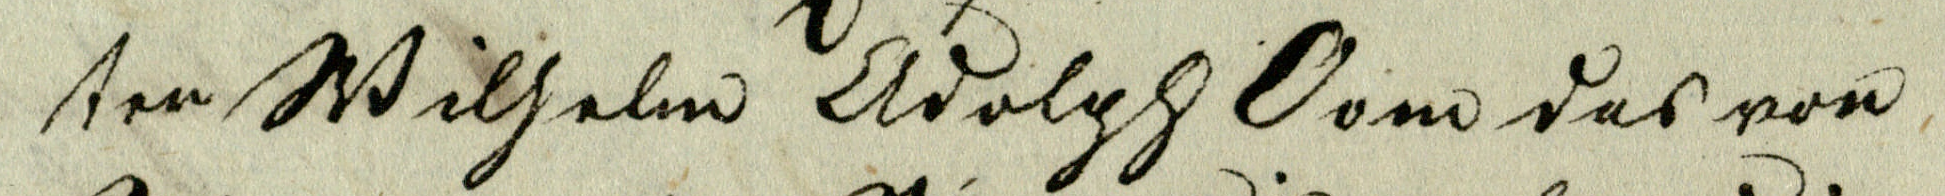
ten Adolph Oom das von
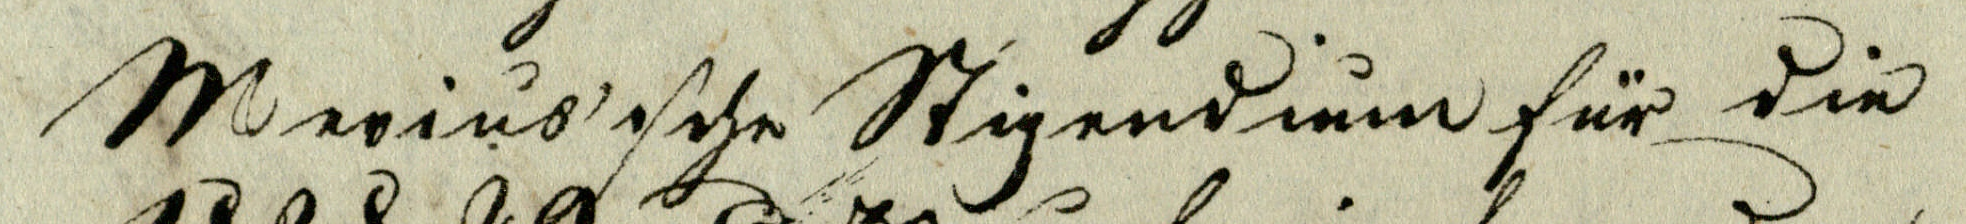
Mevius'sche Stipendium für die
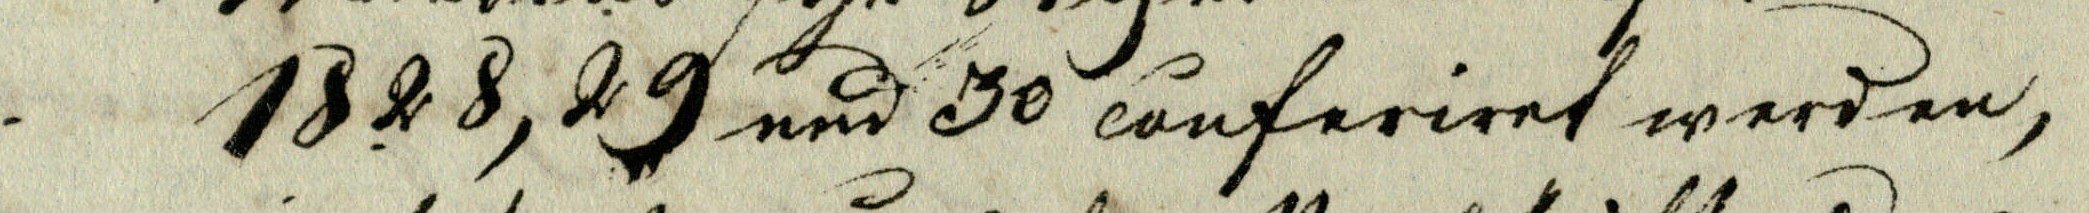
1828, 29 und 30 conferiret werden,
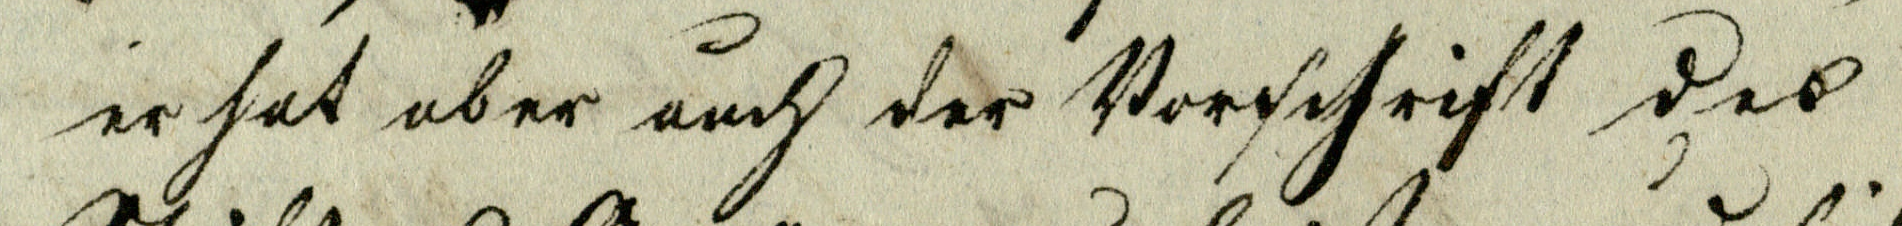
er hat aber auch der Vorschrift des
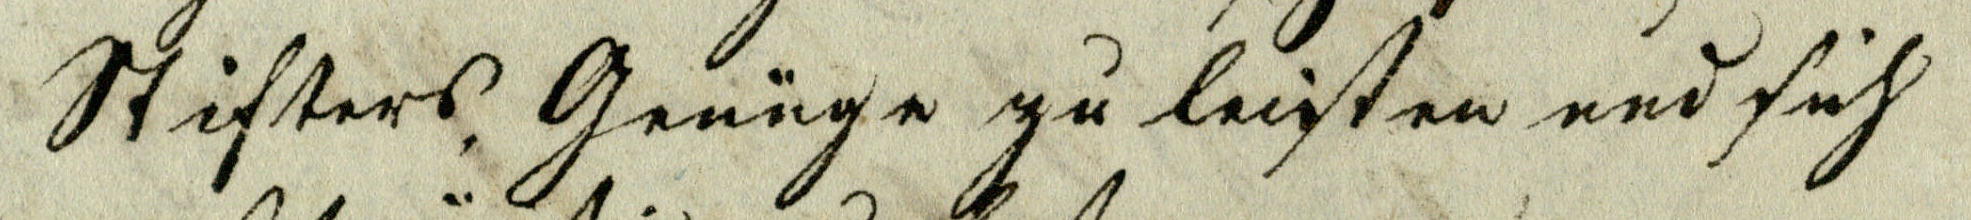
Stifters Genüge zu leisten und sich
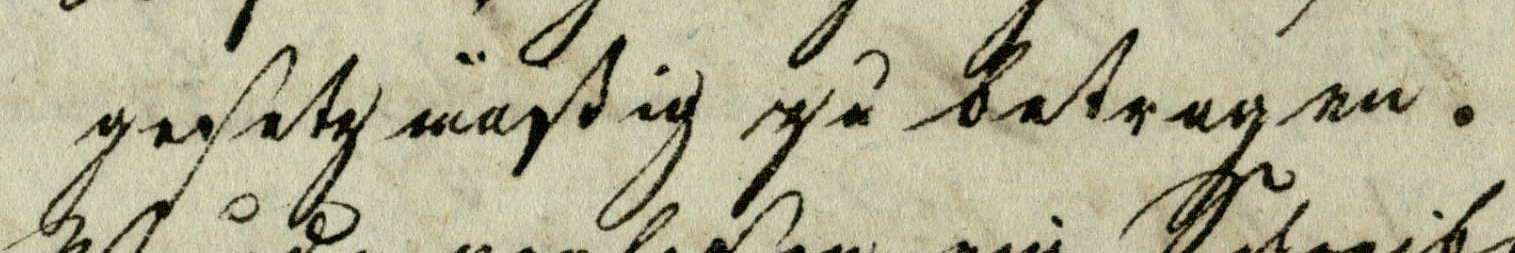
gesetzmäßig zu betragen.
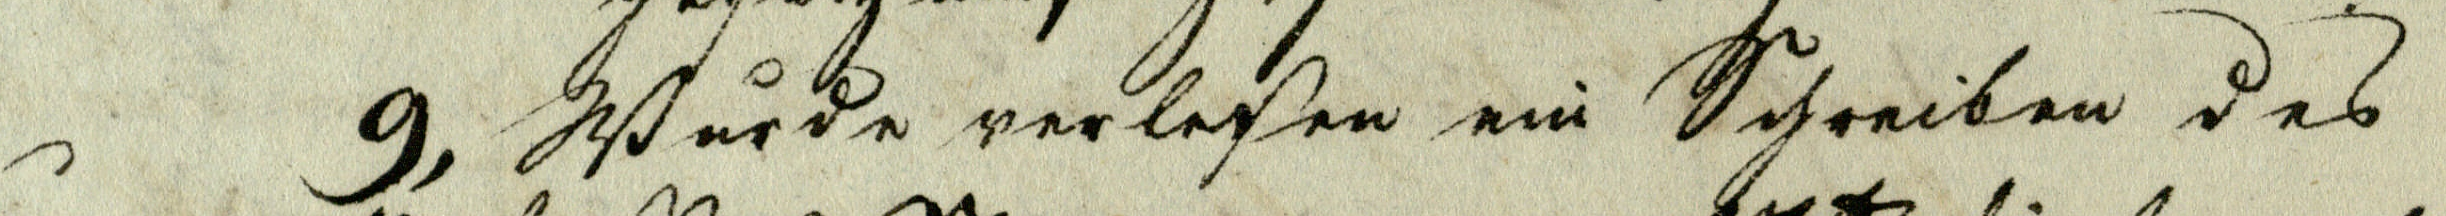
9, Wurde verlesen ein Schreiben des
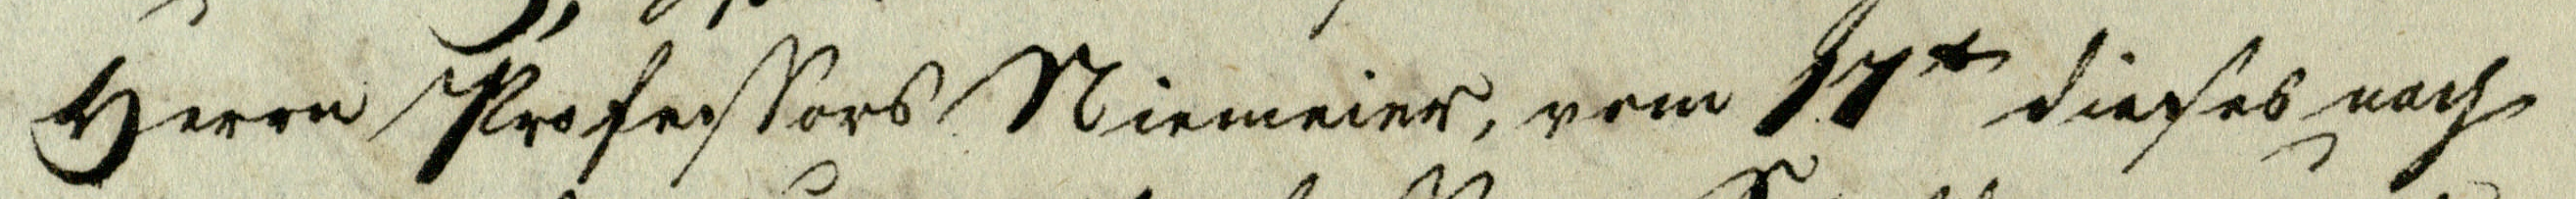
Herrn Professors Niemeier, vom 17ten dieses nach
